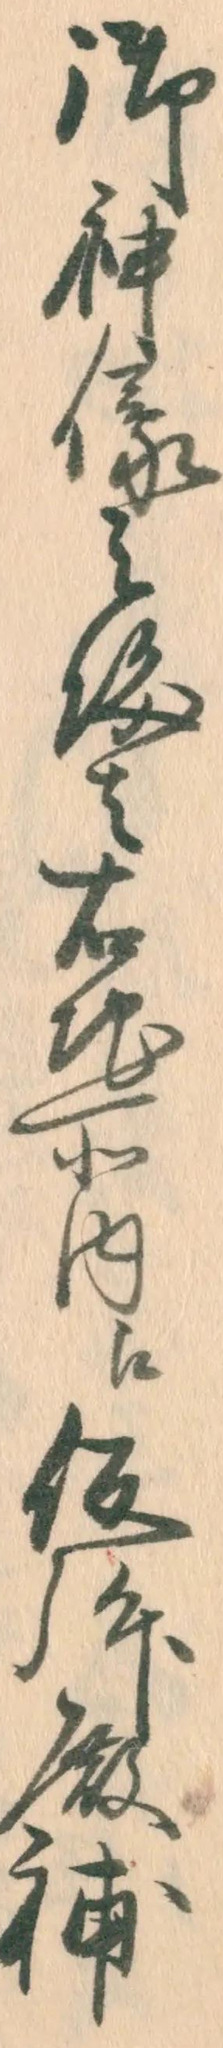御神像之儀は右地所内江仮拝殿補
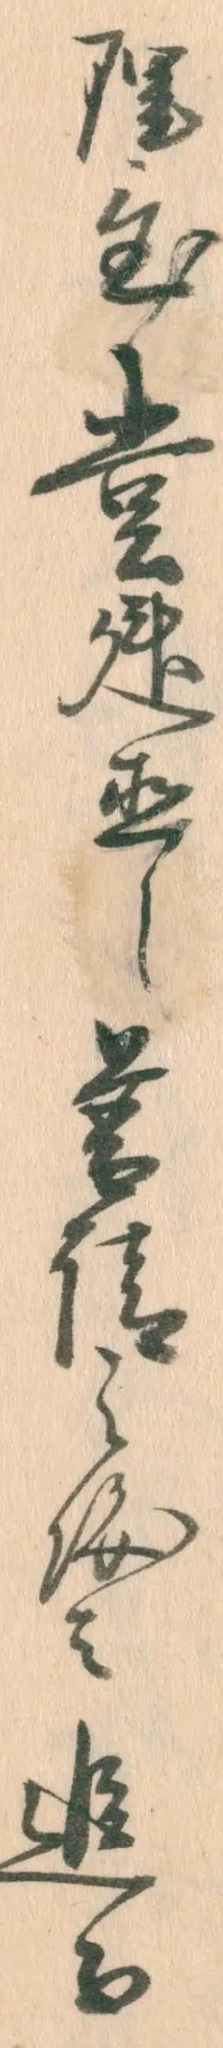理置堂建直し普請之儀は追而
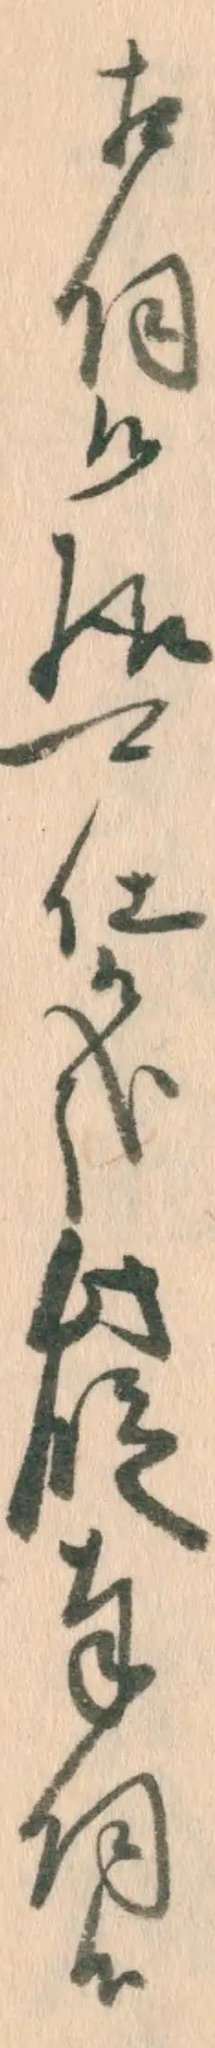相伺候様可仕候哉此段奉伺候
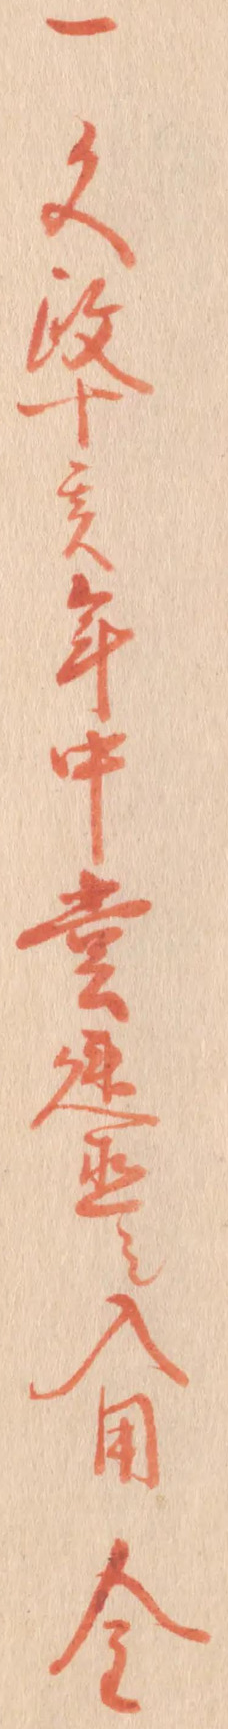一文政十亥年中堂建直し入用金

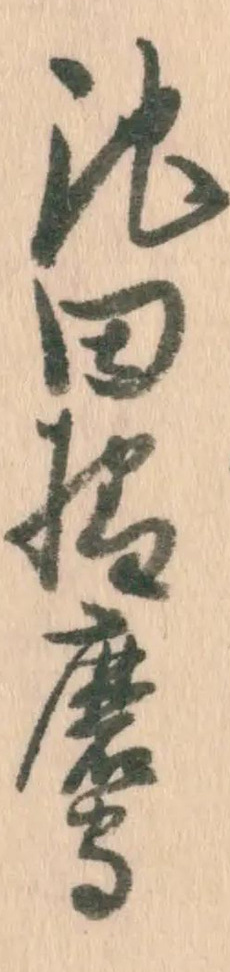池田播磨守
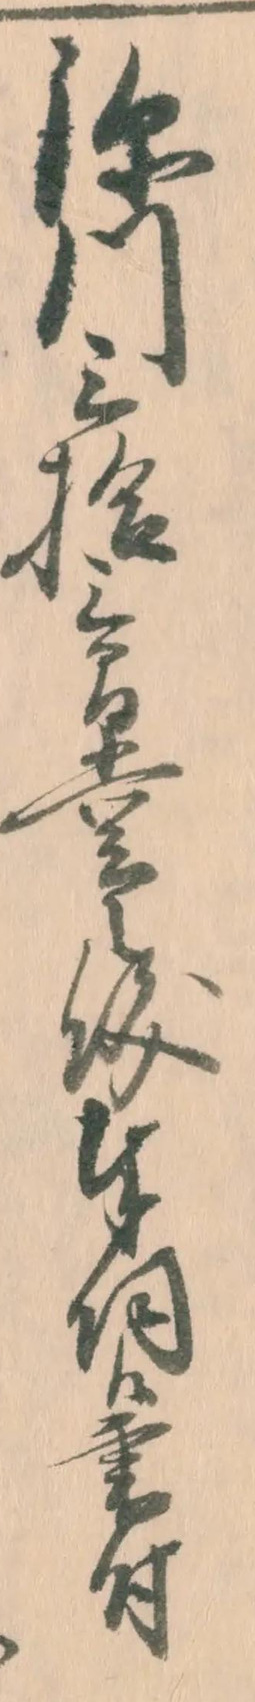│深川三拾三間堂儀奉伺候書付
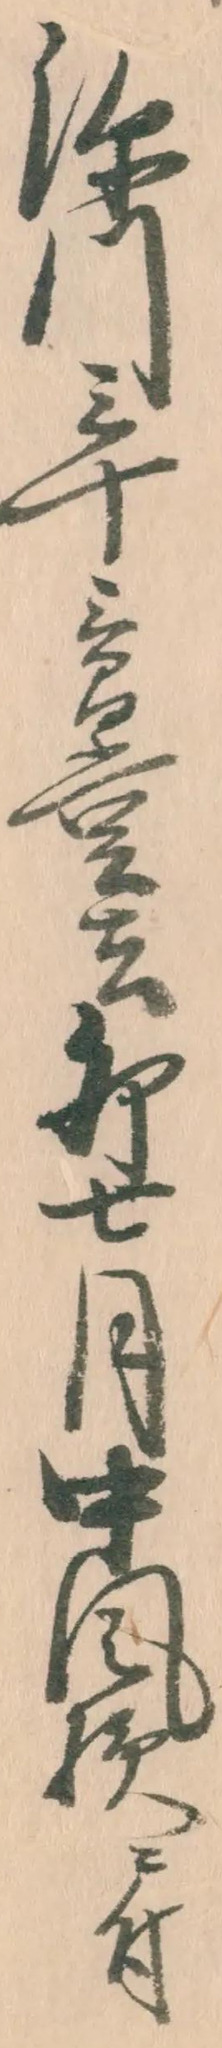深川三拾三間堂去卯七月中風損に付
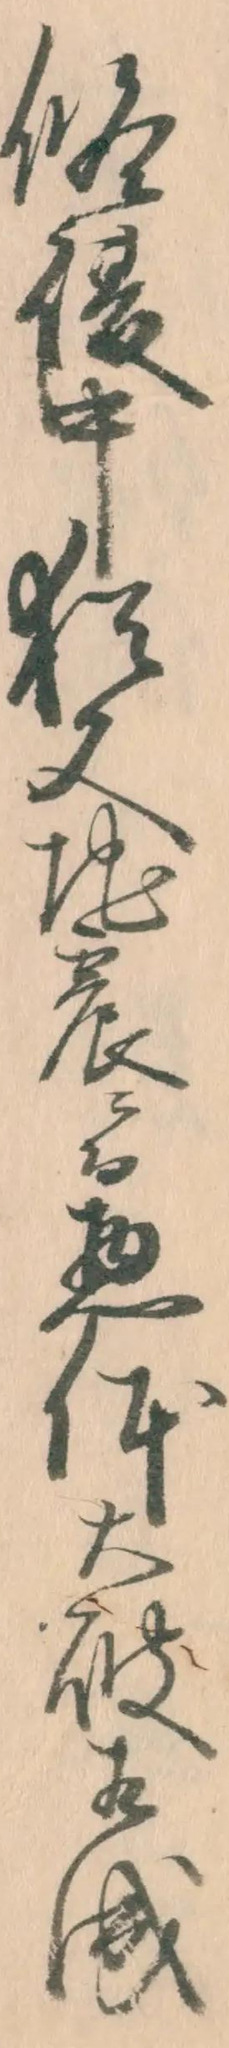修復中猶又地震に而惣体大破相成

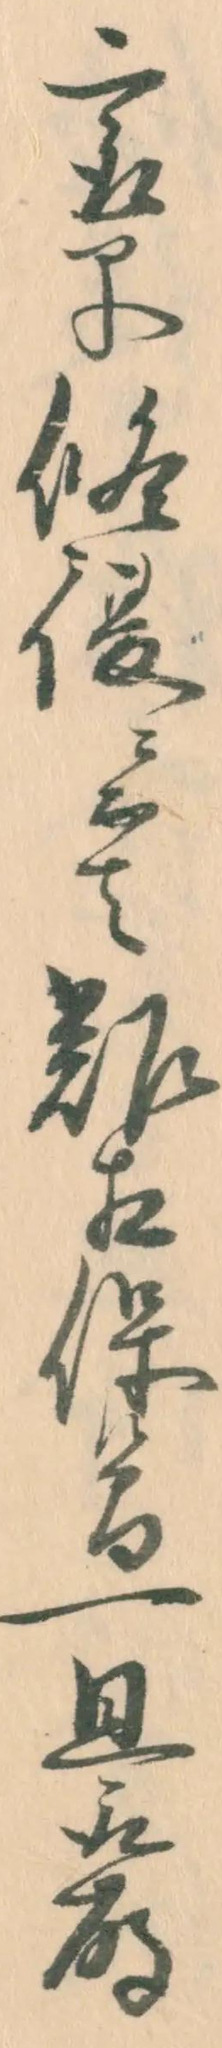最早修復に而は難相保候間一旦取崩
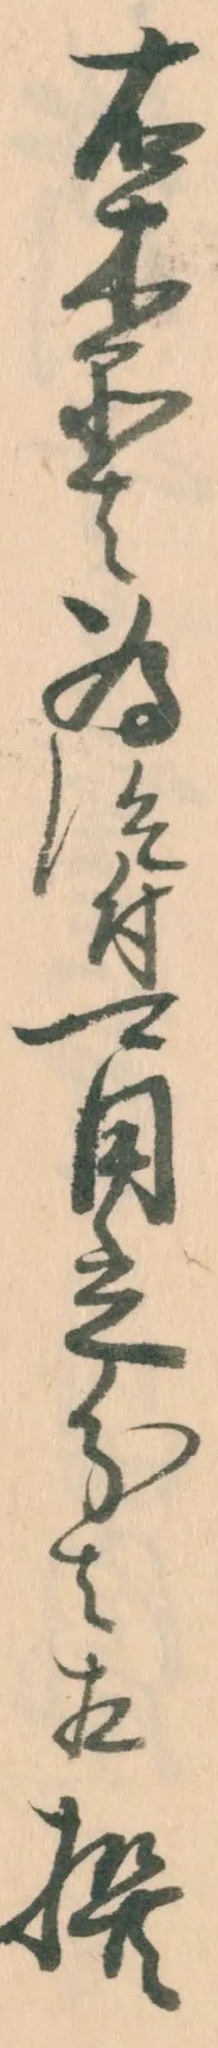右木品は為仰付可用立分は相撰
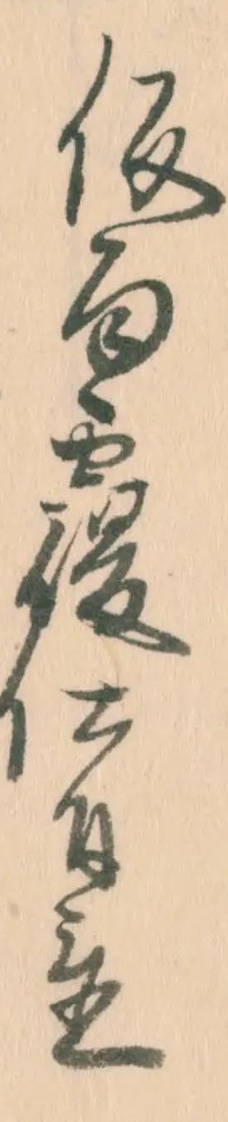仮雨覆仕付置
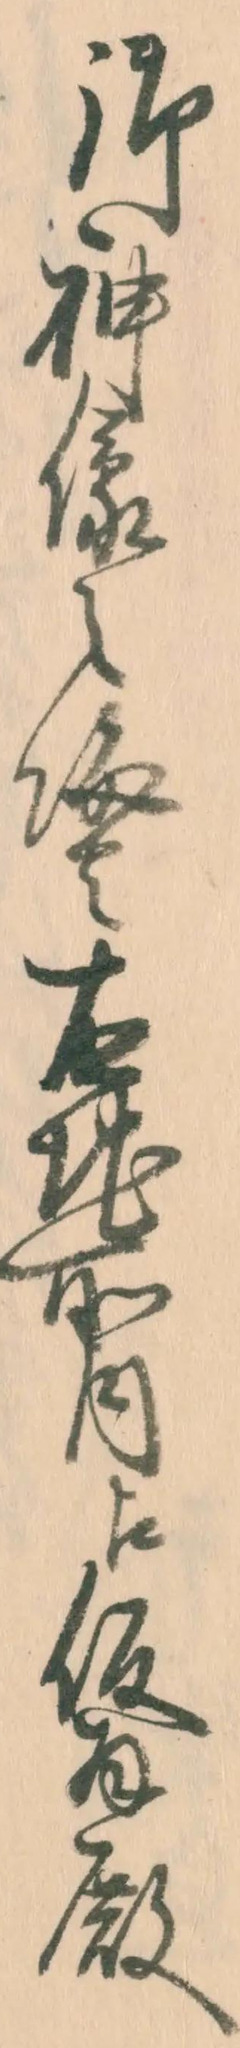御神像之儀は右地所内え仮拝殿
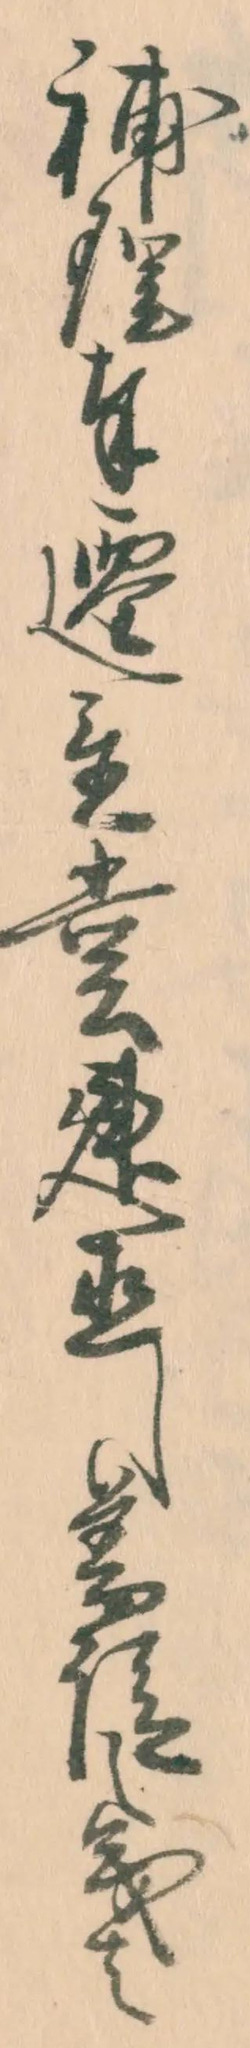補理奉遷置堂建直し普請之義は
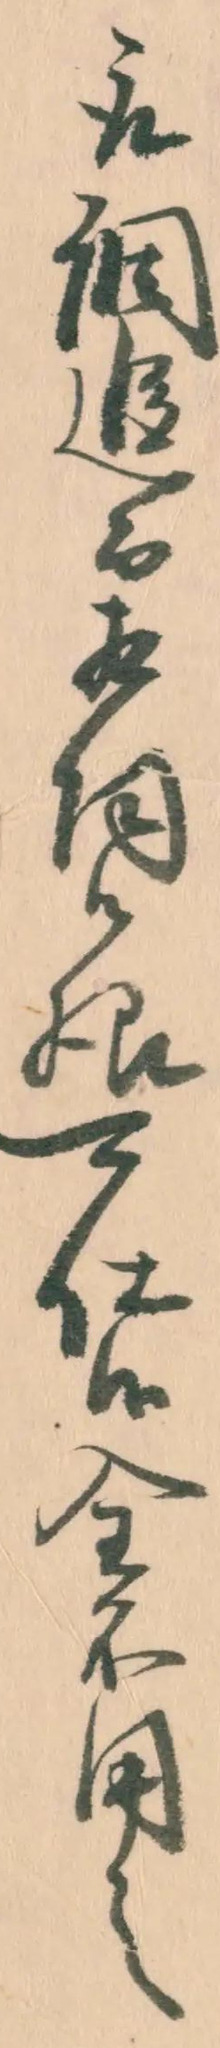取調追而相伺候様可仕候全不用之
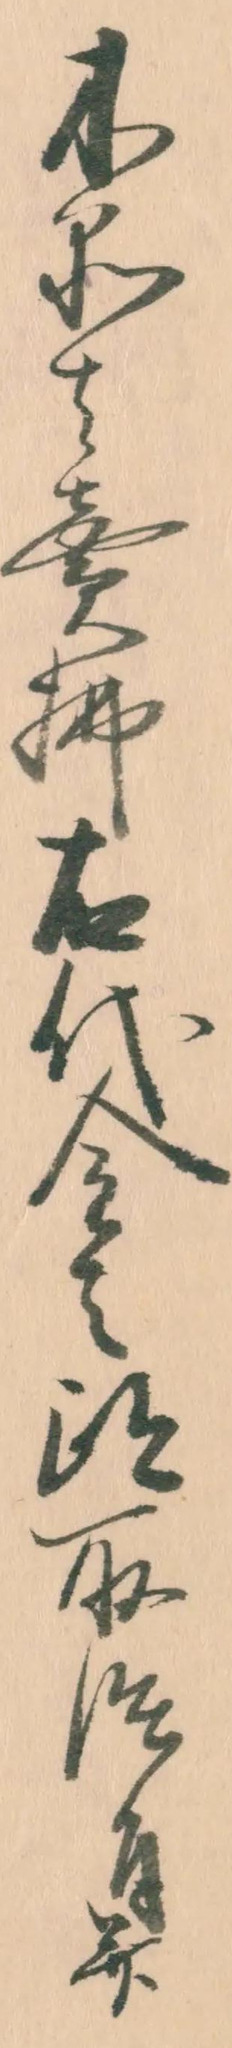木品は売払右代金は跡取仰付幷
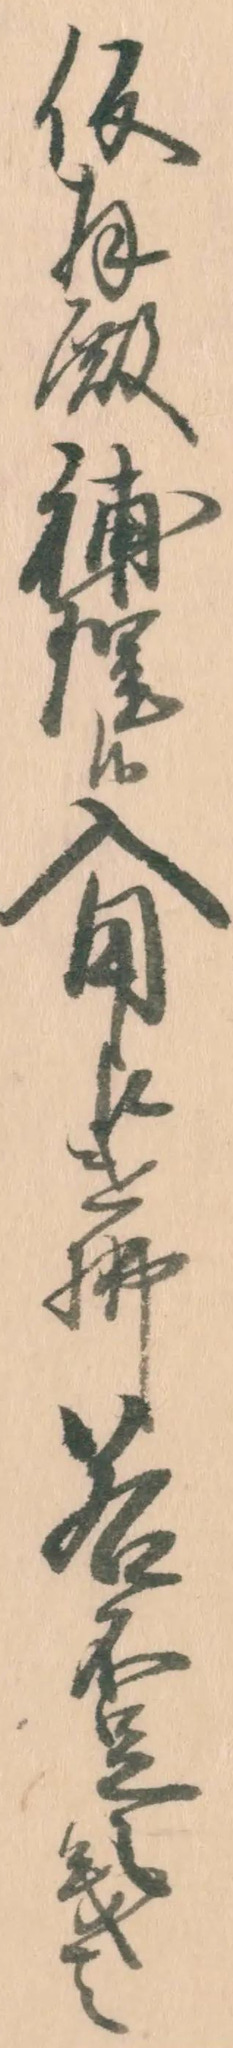仮拝殿補理候入用え遣払若不足之義は
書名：三十三間堂. [1]
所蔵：国立国会図書館 National Diet Library, JAPAN
